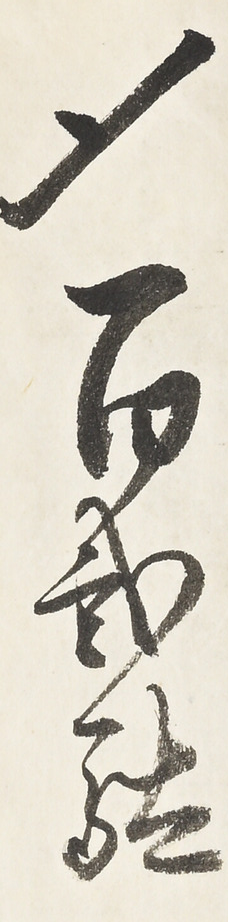〆百弐駄
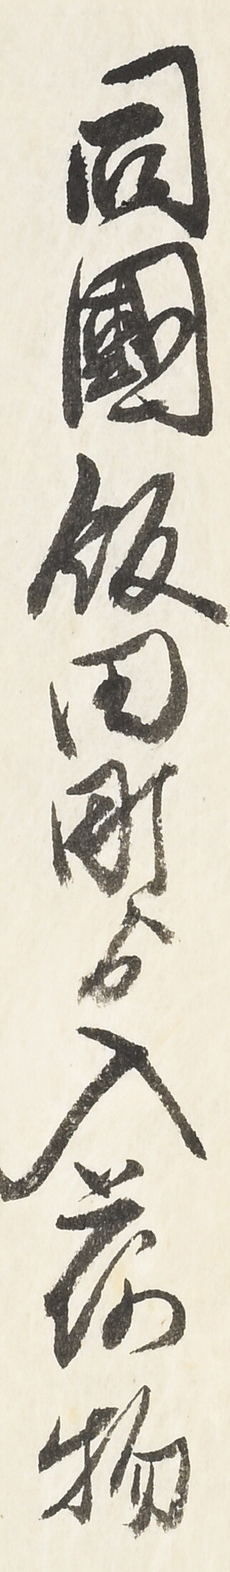同國飯田町ゟ入荷物
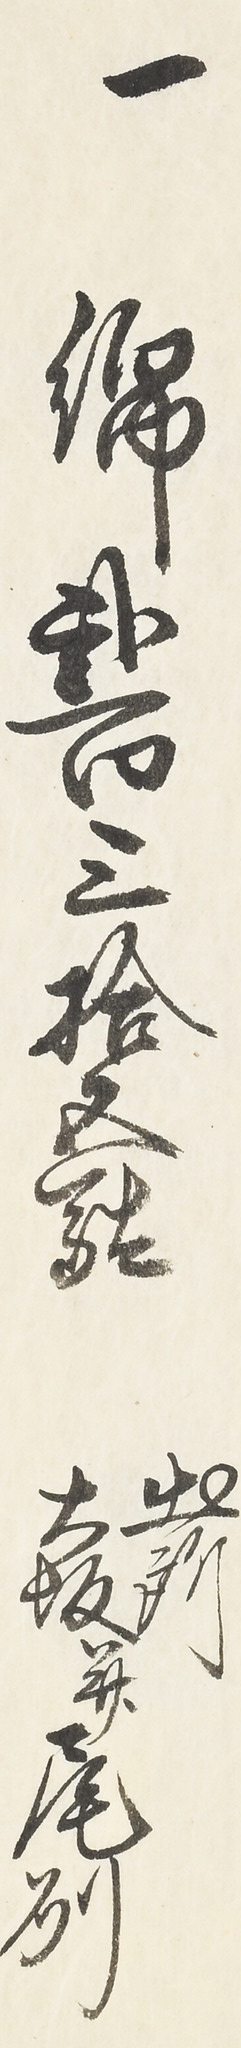一綿弐百三拾五駄出所
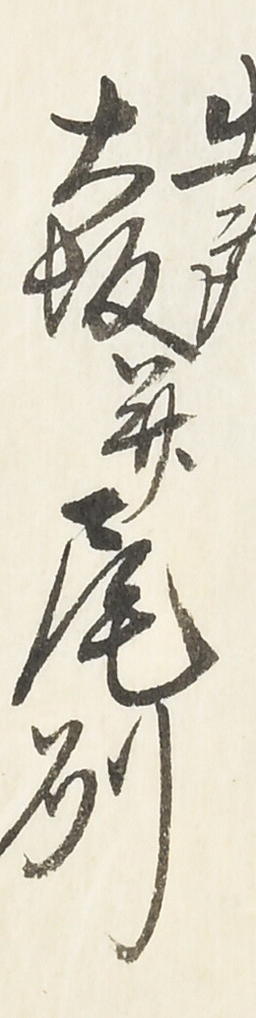大阪并尾州
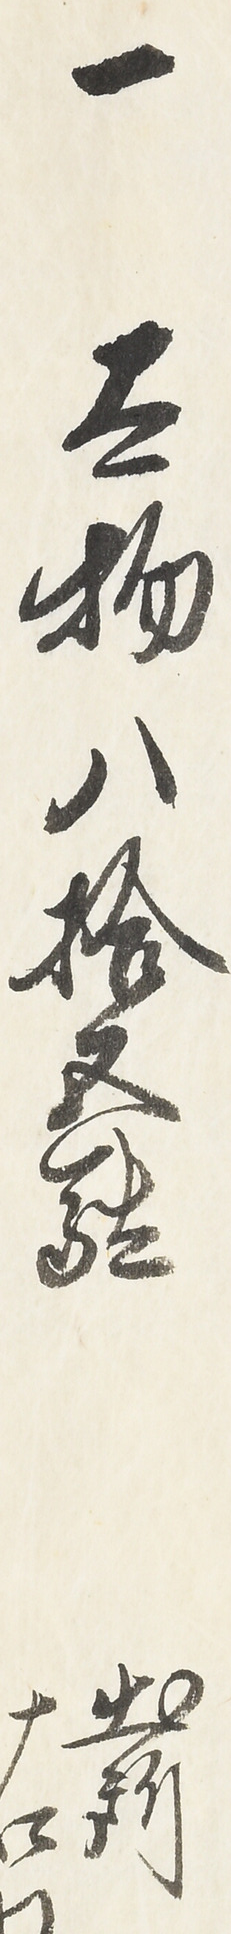一太物八拾五駄出所
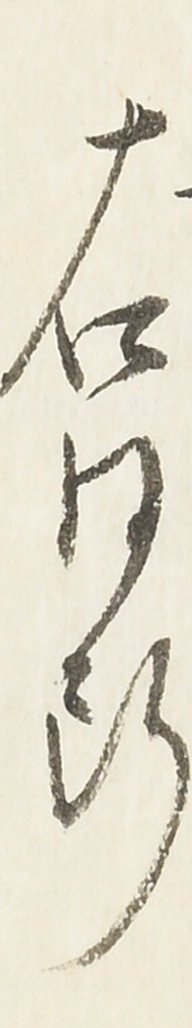右同断
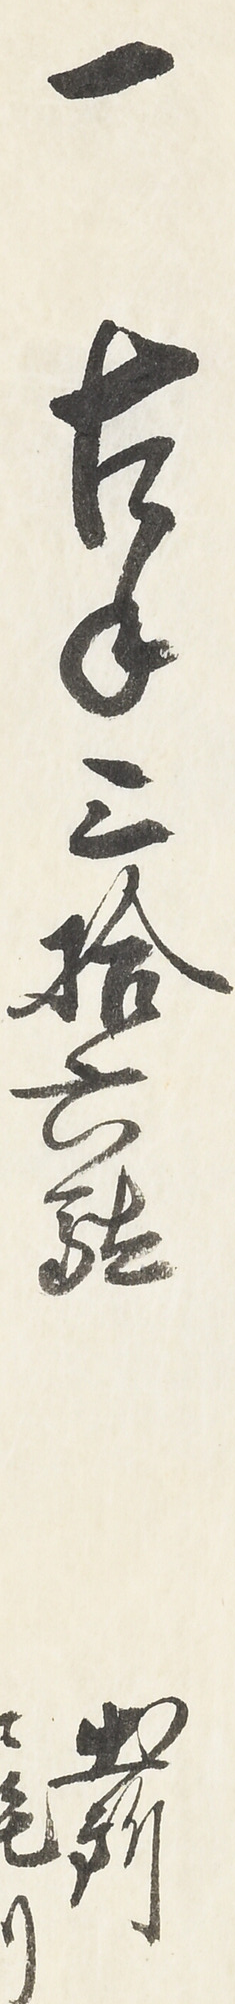一古手三拾六駄出所
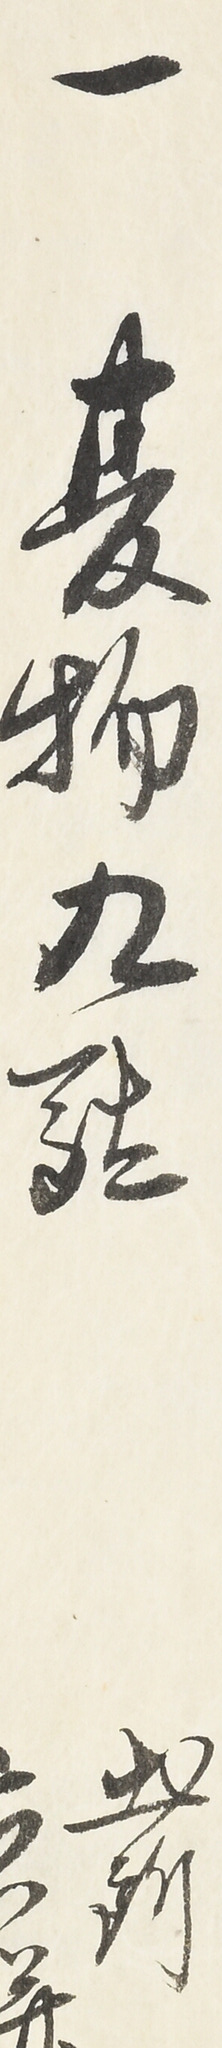一夏物九駄出所
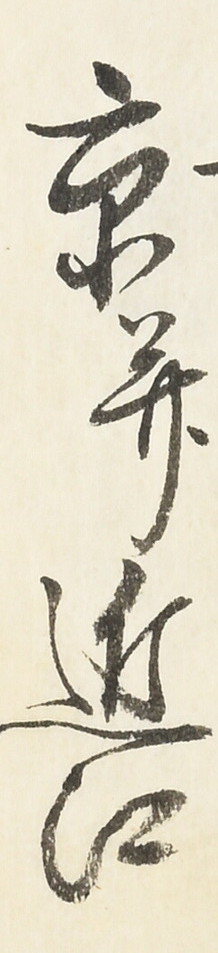京并近江

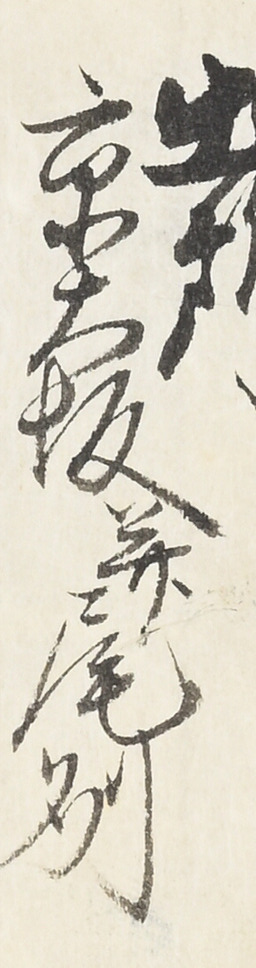京大坂并尾州
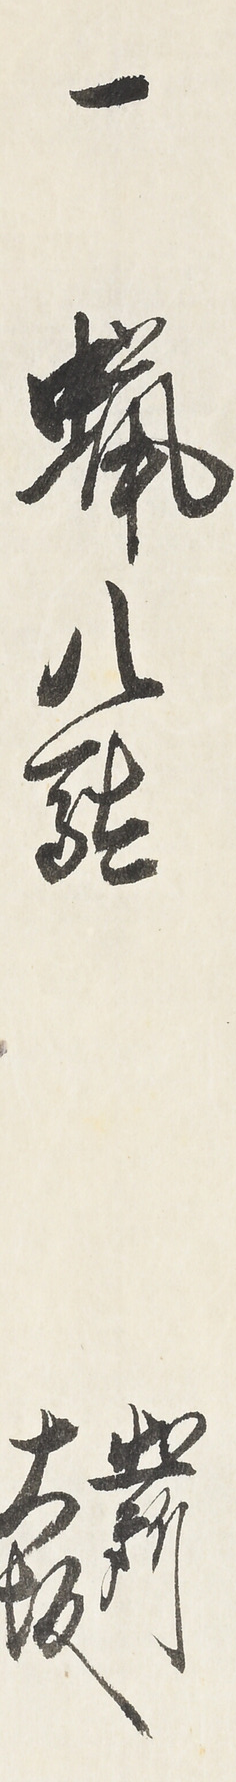一蝋八駄出所
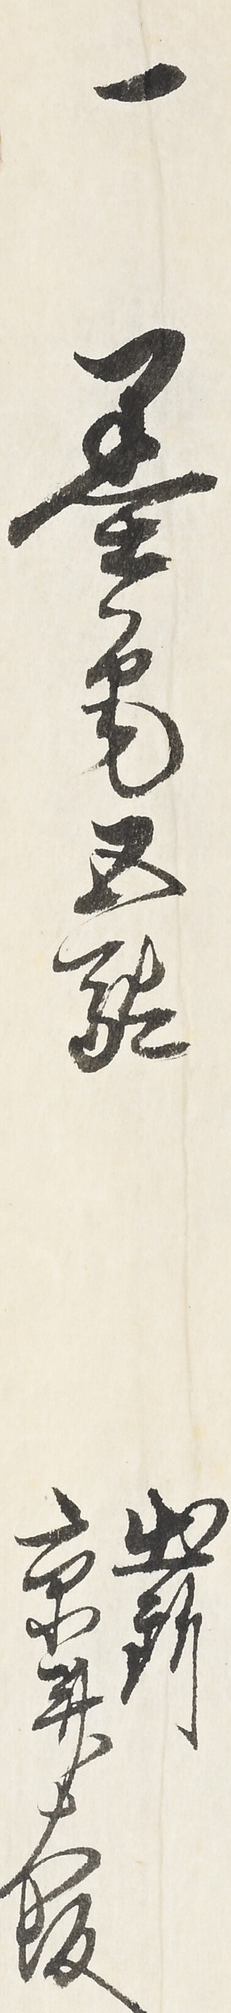一墨筆五駄出所
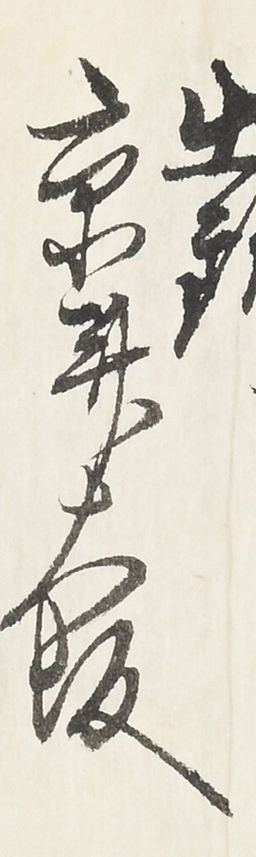京并大坂
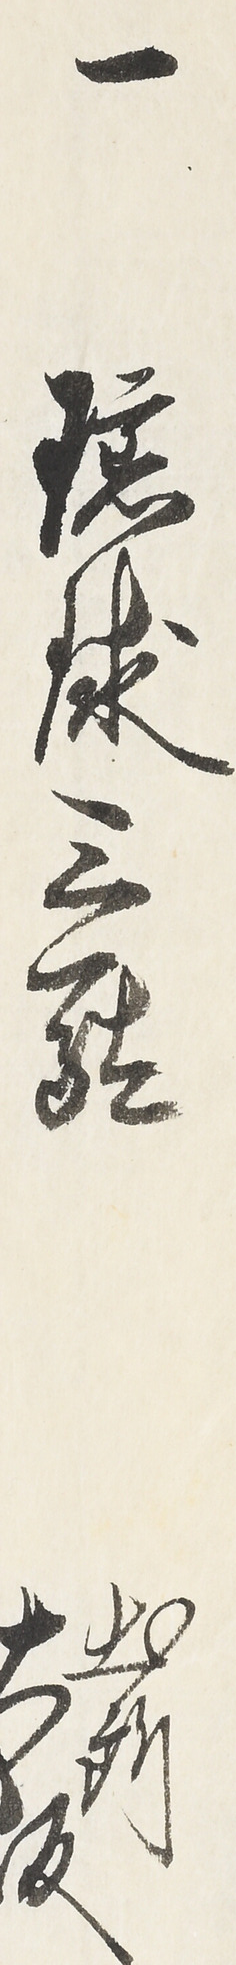一琉球三駄出所
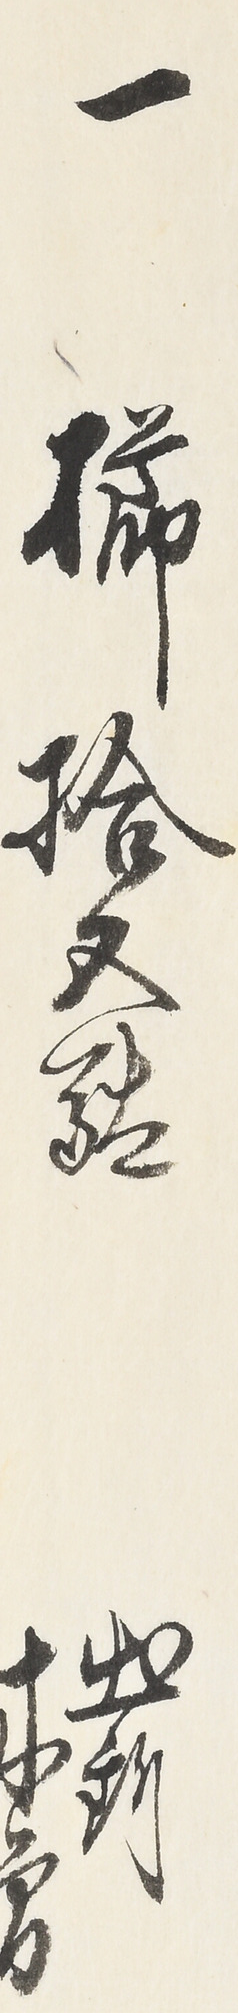一櫛拾五駄出所
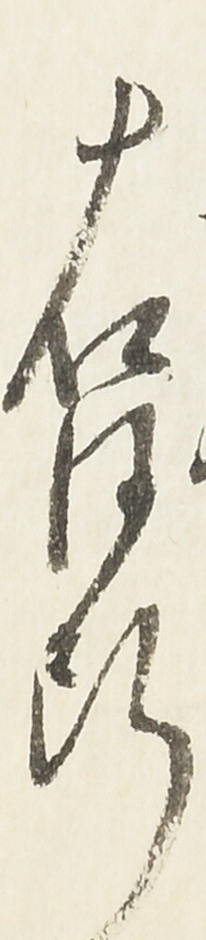右同断
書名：中馬ニテ附通候出入荷物目録帳
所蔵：伊那市立高遠町図書館・合同会社AMANE
